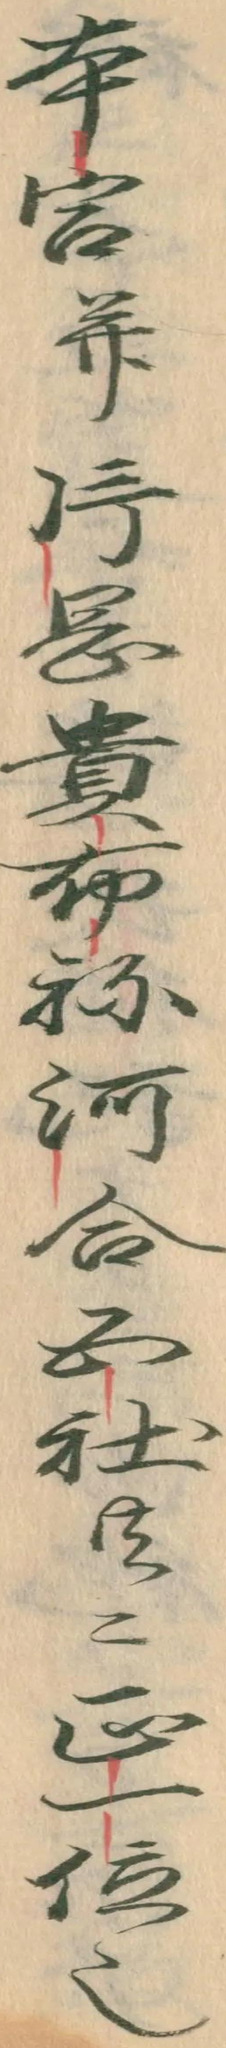本-宮并片_岡貴-布-祢河_合五-社共ニ正-一-位也
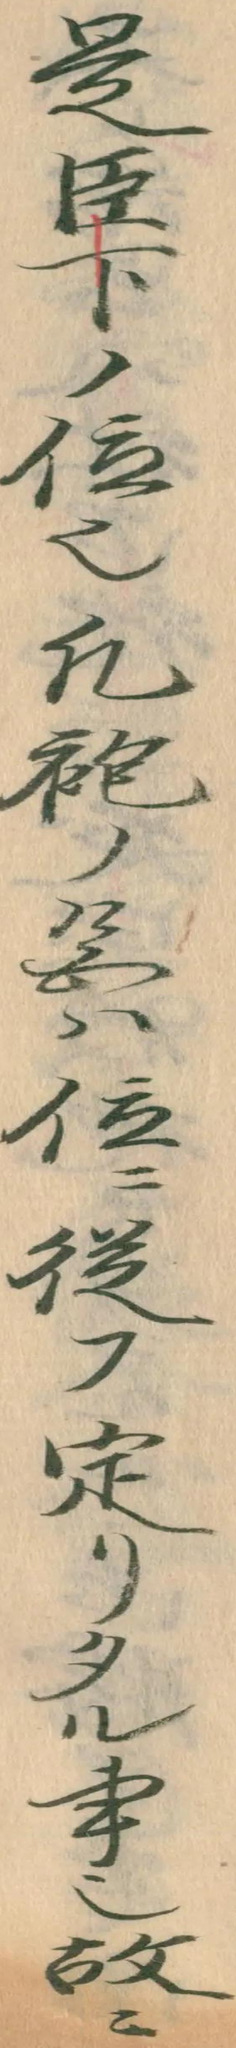是臣-下ノ位也凡袍ノ色ハ位ニ従フ定リタル事也故ニ
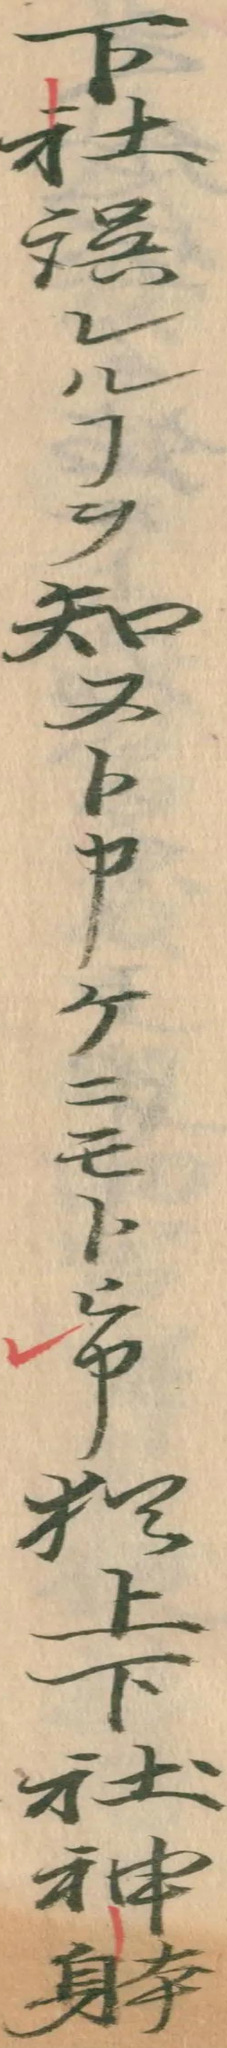下_杜誤レルコトヲ知ヌト申ケニモト被申猶上下社神-体
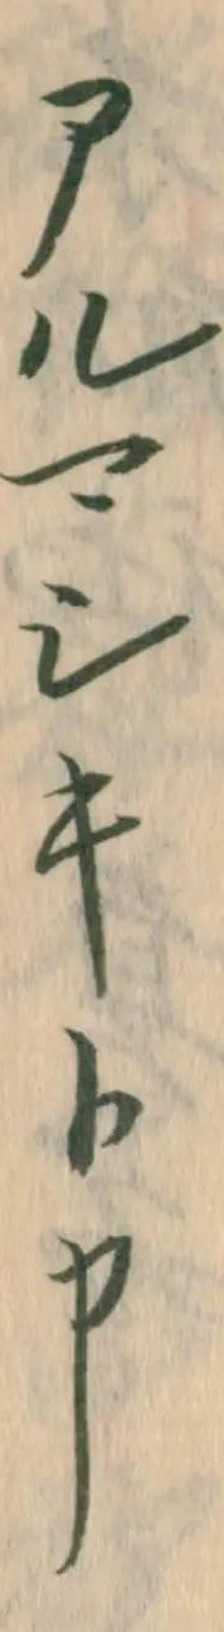アルマシキト申
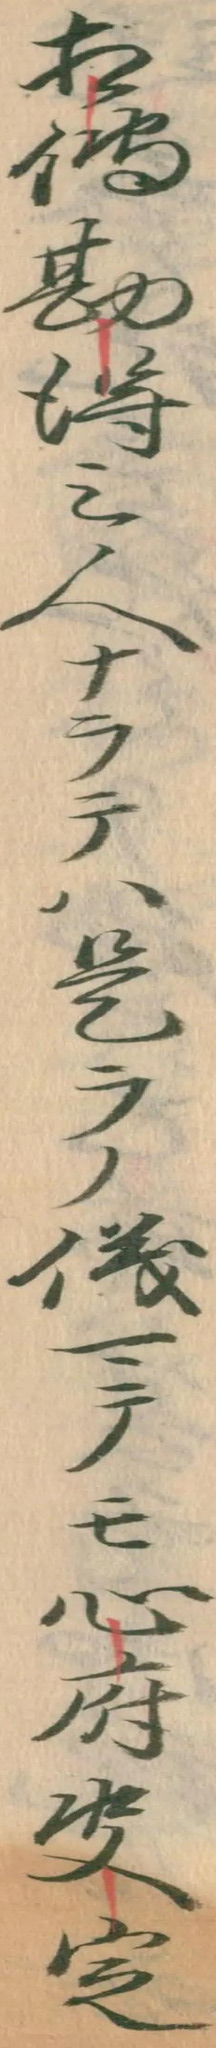相-伝勘-得之人ナラテハ是ラノ儀マテモ心-府決-定
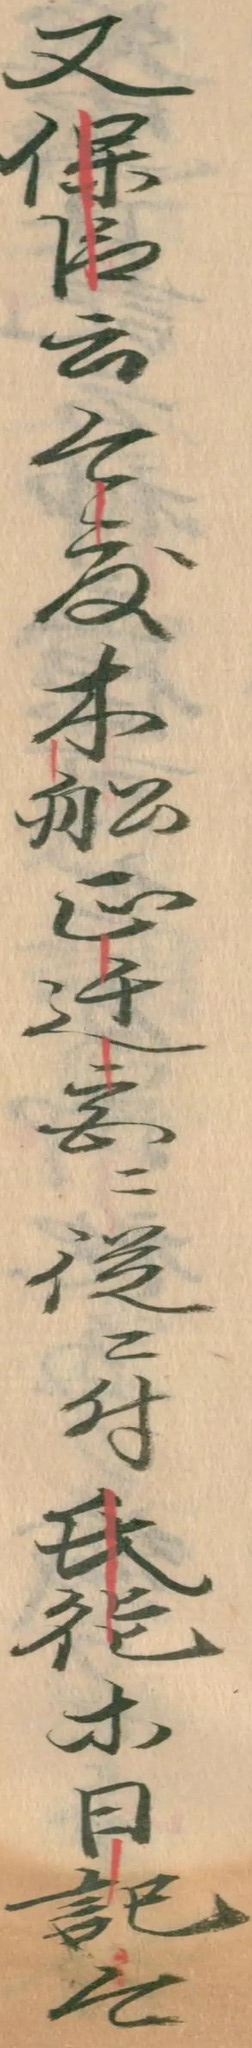又保臣云今-度木_船正-迁-宮ニ従ニ付氏能等日-記-今
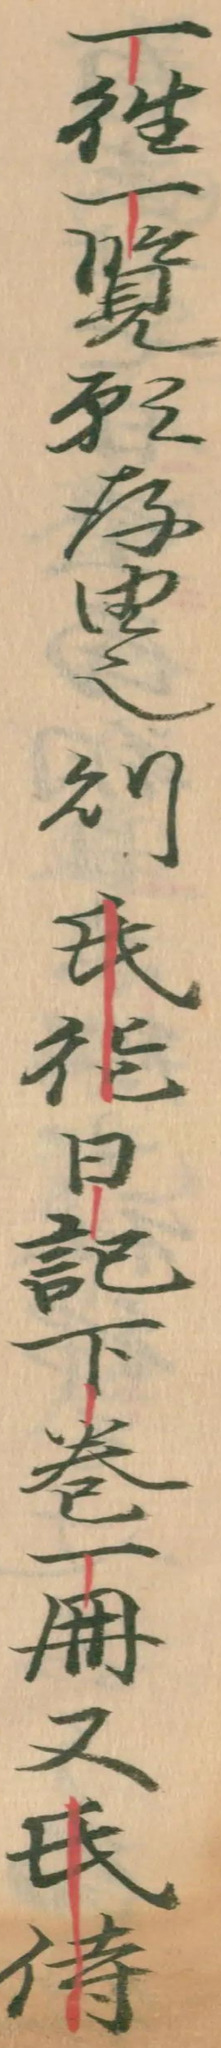一-往一-覧願存由也則氏能日-記下-巻一-冊又氏侍
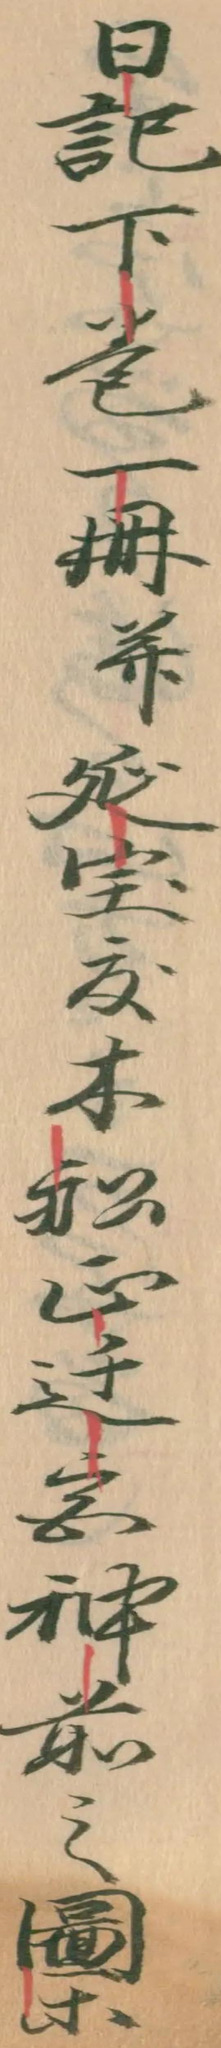日-記下-巻一-冊并延-宝度木_船正-迁-宮神-前之図_等
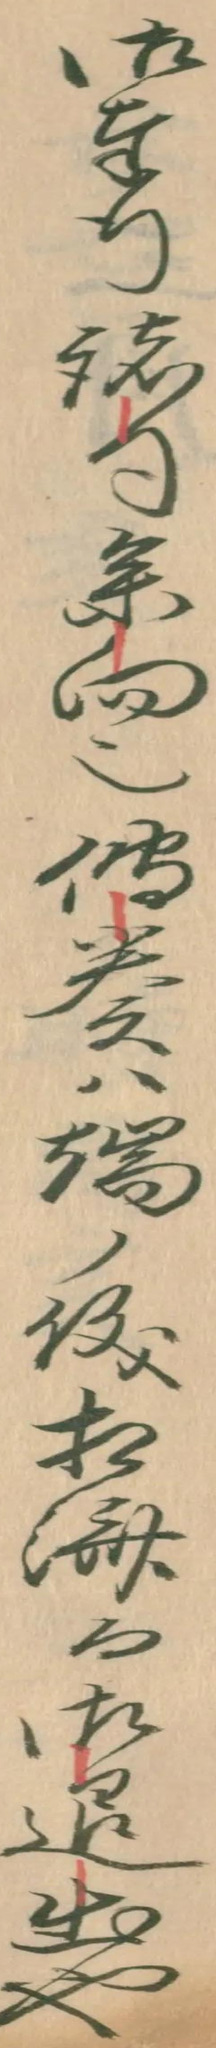御奉行諸-司参-向也伝-奏ハ端ノ儀相済而御-退-出也
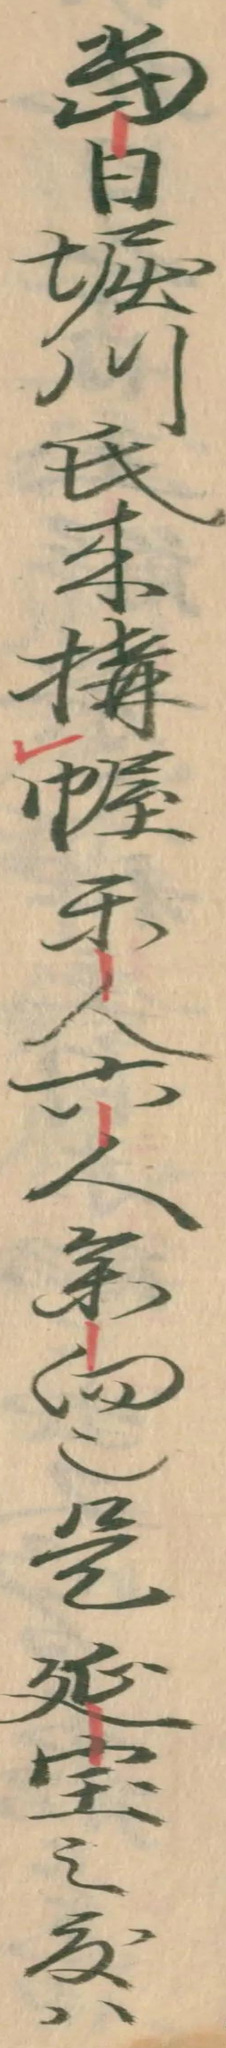当-日堀川氏来構幄楽-人六-人参-向也是延-宝之度ハ

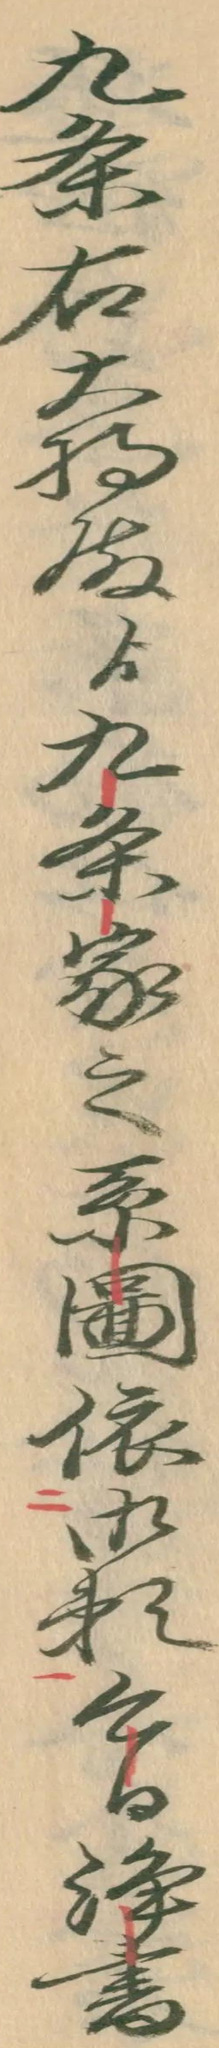九条右大将殿ゟ九-条-家之系-図依御頼今-日浄-書
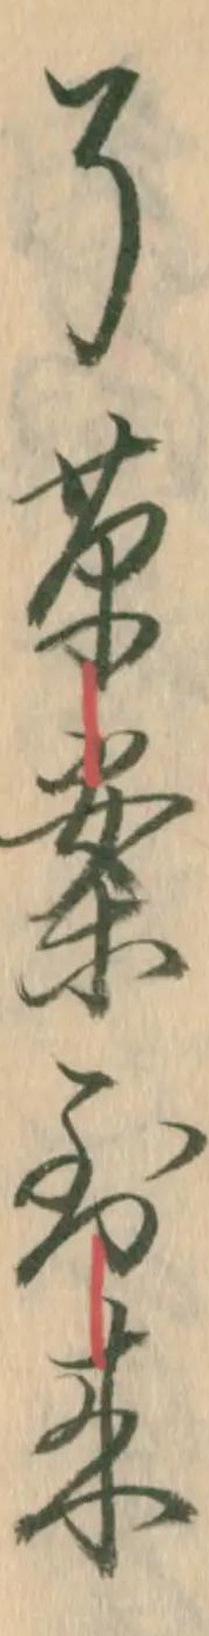了草-案到-来
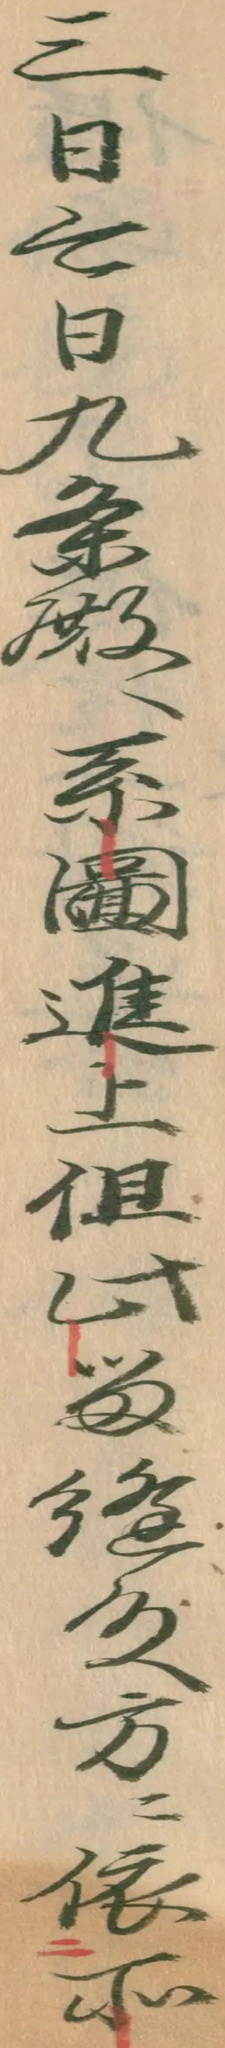三日今日九条殿へ系-図進-上但此_留縫殿方ニ依所-
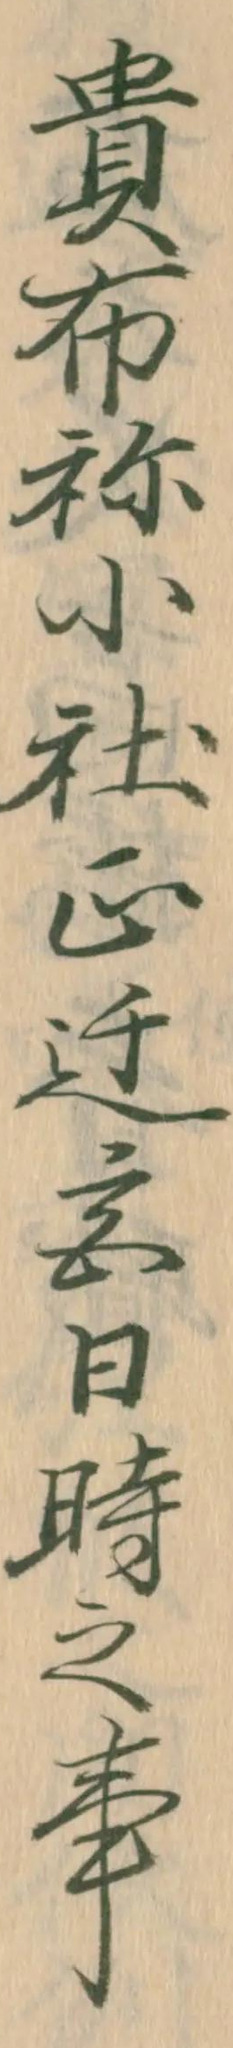貴布祢小社正迁宮日時之事
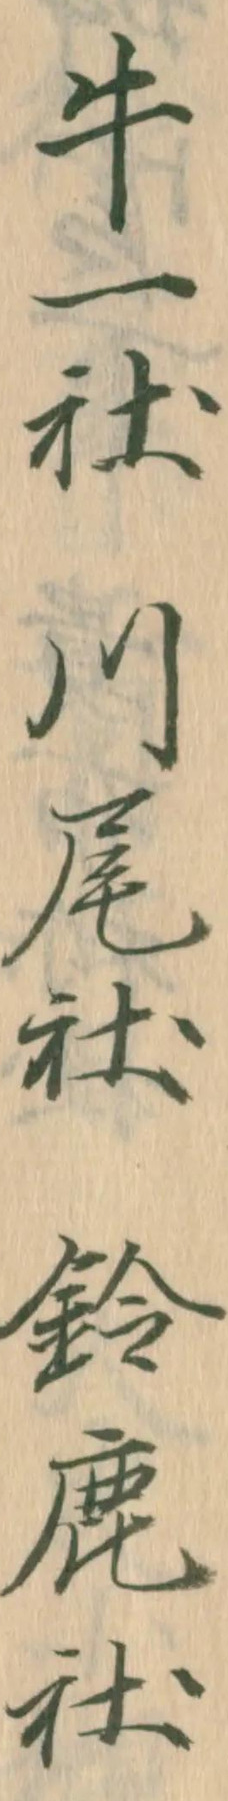牛一社川尾社鈴鹿社
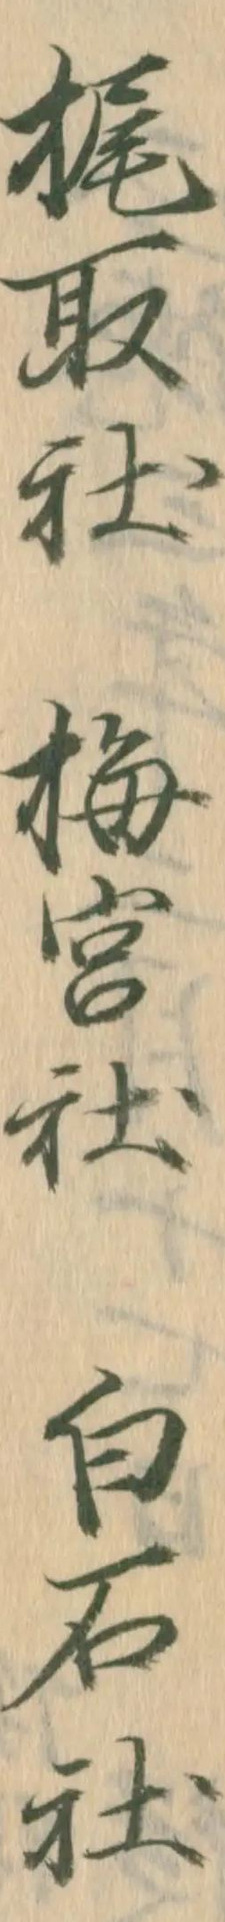梶取社梅宮社白石社
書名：賀茂社記録. 第16冊
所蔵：国立国会図書館 National Diet Library, JAPAN
